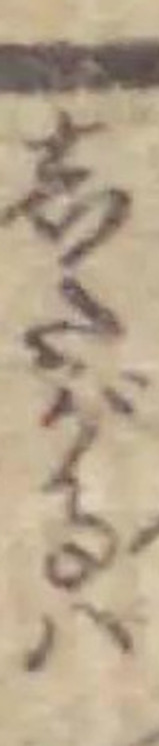したが事は
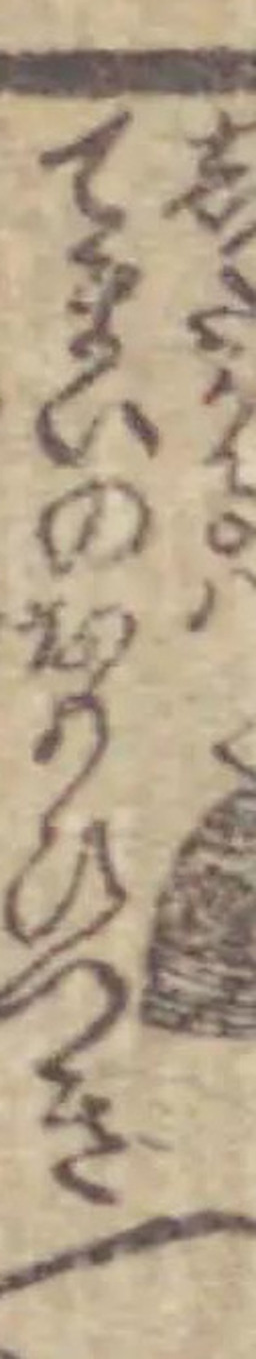てまいのおもひつき
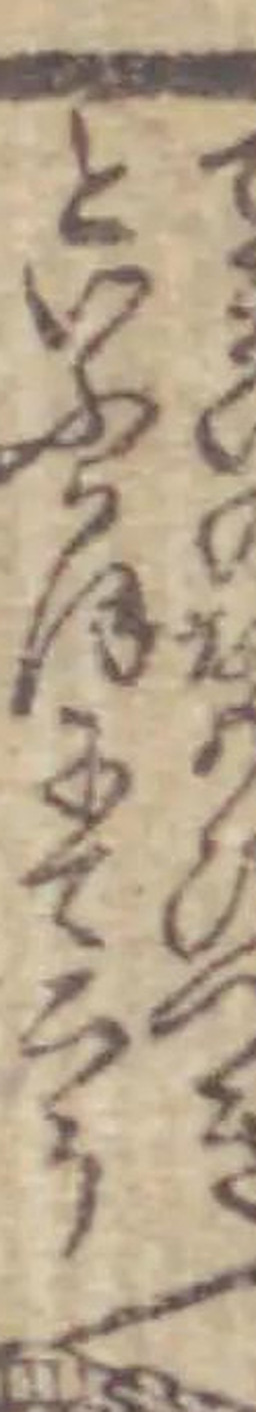といふかほにてこう
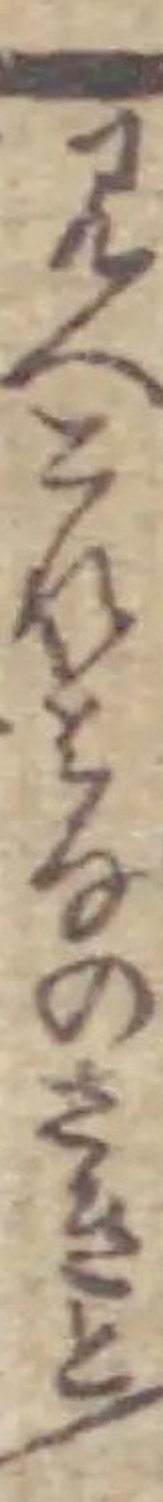見へこれをはなのさきと
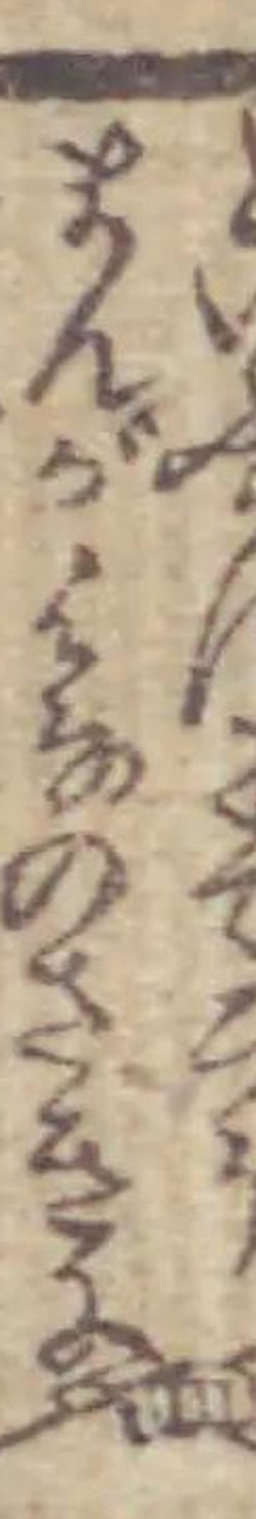まんがはなのさきに
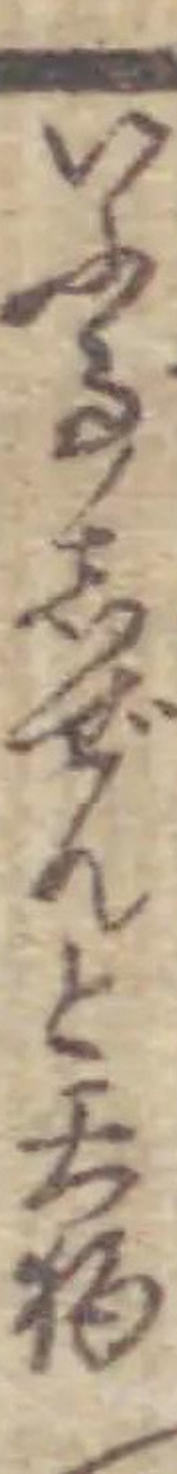いふ事しぜんと天狗
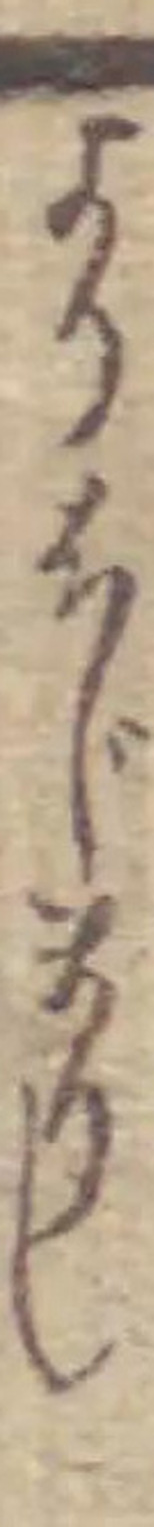よりはじまりし
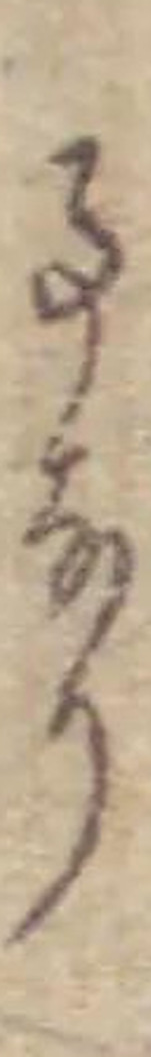事なり
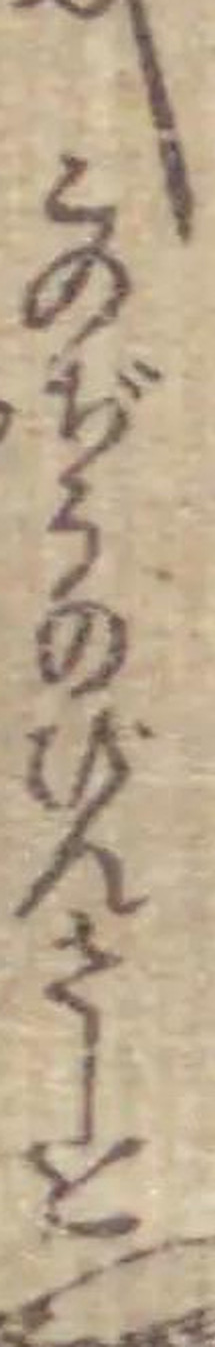「このぢうのびんさしを
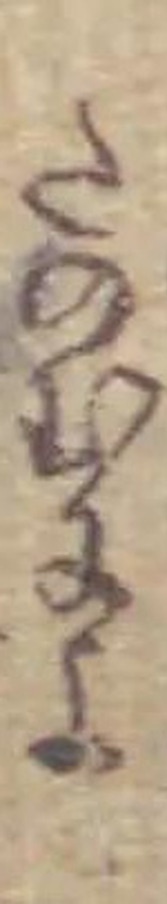たのむによ
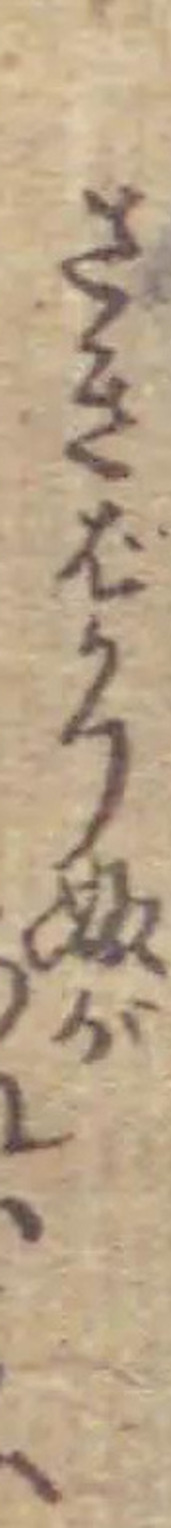さきばかりふが
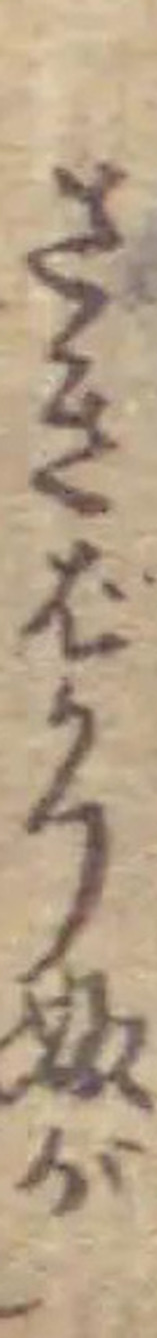さきばかりふが
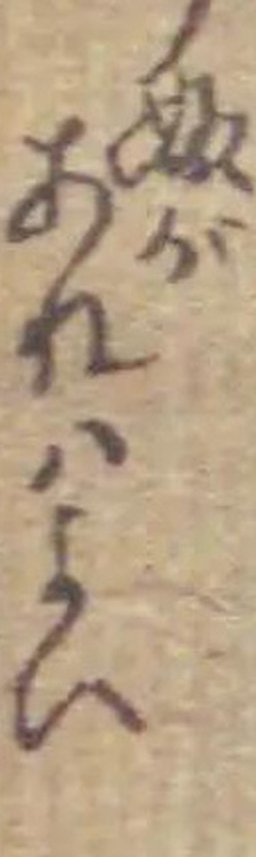あれはよい

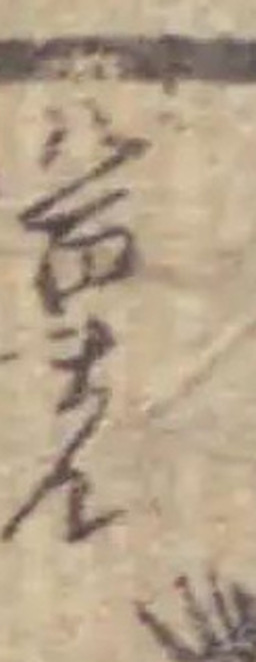八百まん
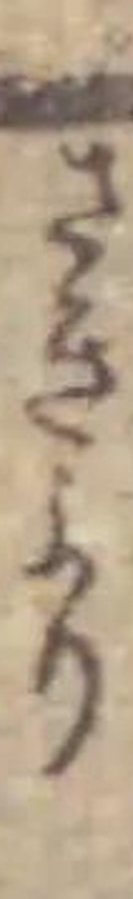さきより
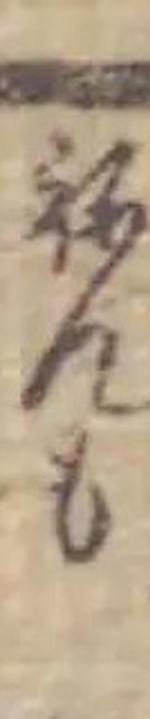ねんも
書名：珍説女天狗 2巻
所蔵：国立国会図書館 National Diet Library, JAPAN
